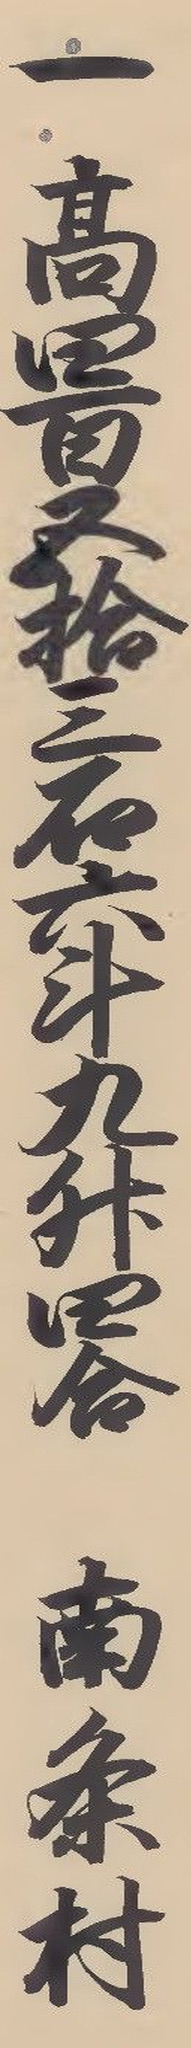一高四百五拾三石六斗九升四合南条村
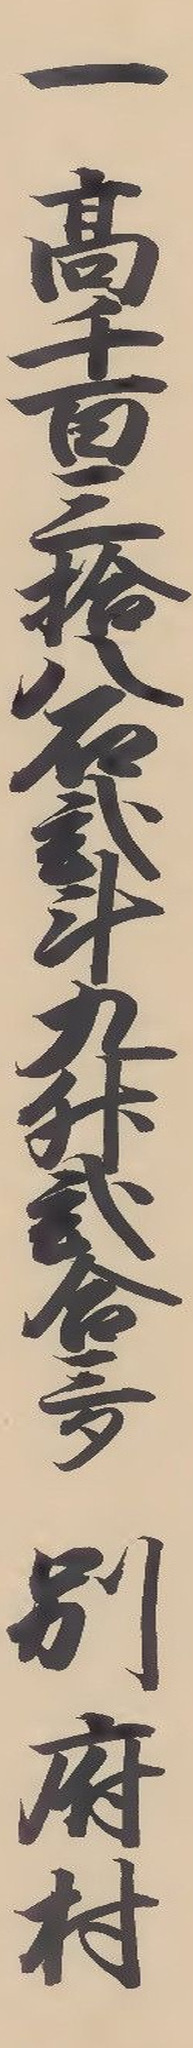一高千百三拾八石弐斗九升弐合三勺別府村
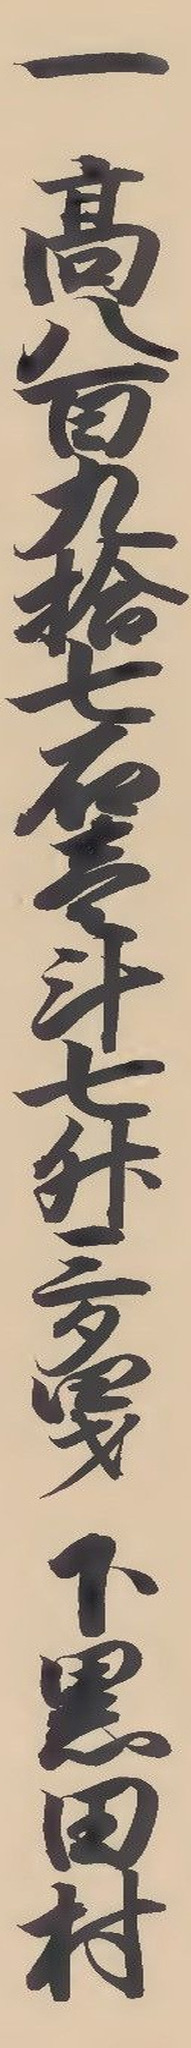一高八百九拾七石壱斗七升三勺四才下黒田村
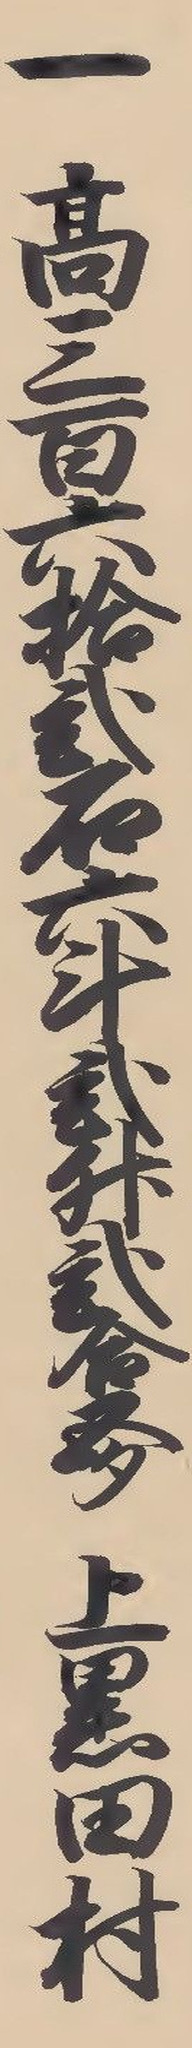一高三百六拾弐石六斗弐升弐合五勺上黒田村
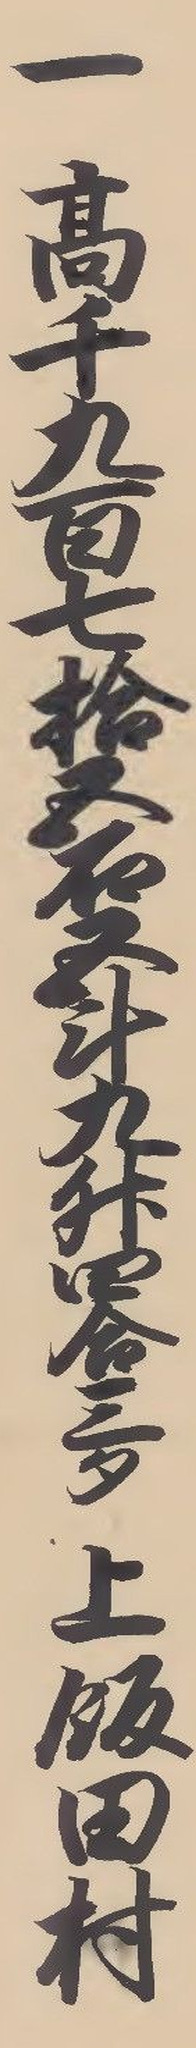一高千九百七拾五石五斗九升四合三勺上飯田村
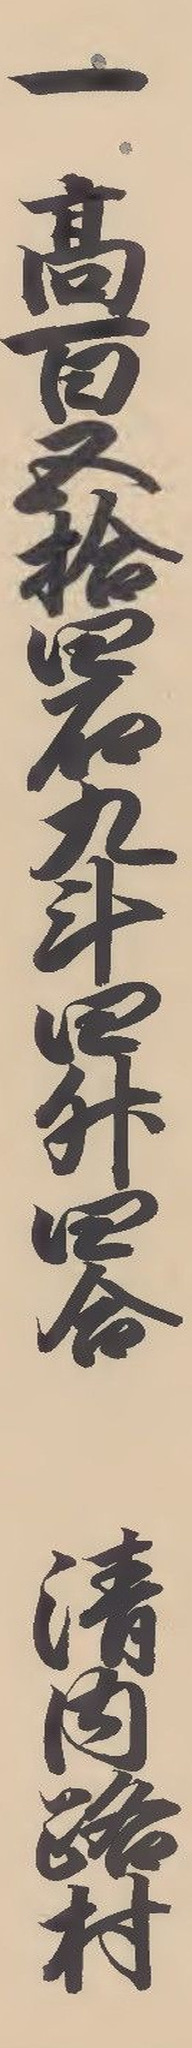一高百五拾四石九斗四升四合清内路村
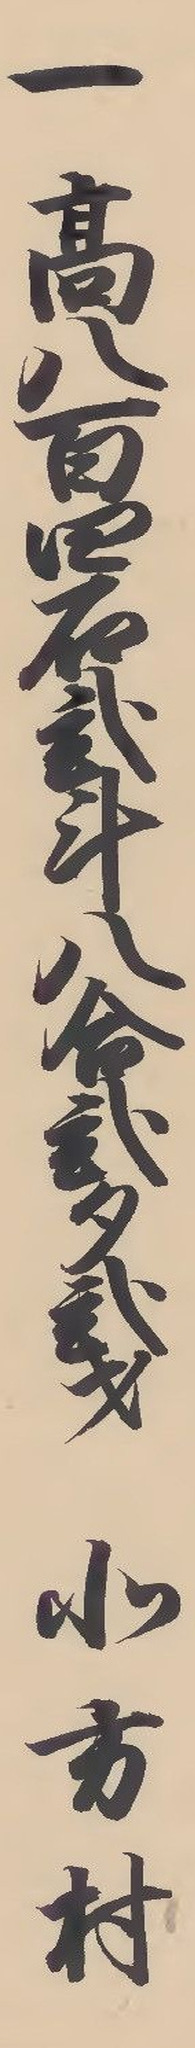一高八百四石弐斗八合弐勺弐才北方村

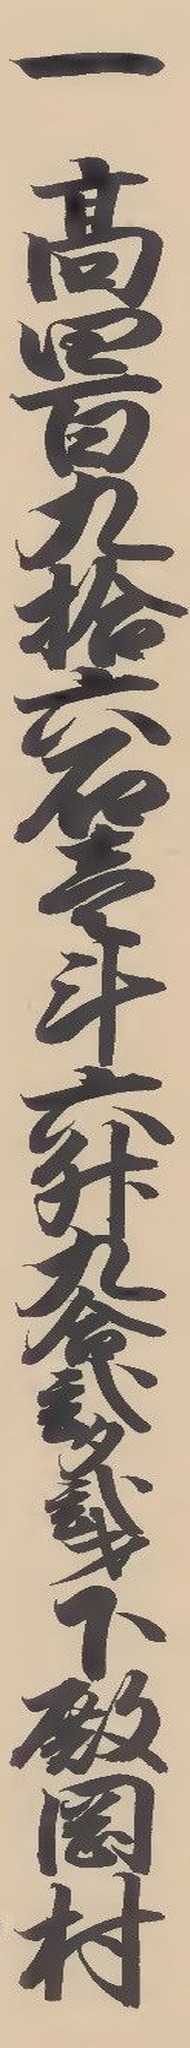一高四百九拾六石壱斗六升九合弐勺弐才下殿岡村
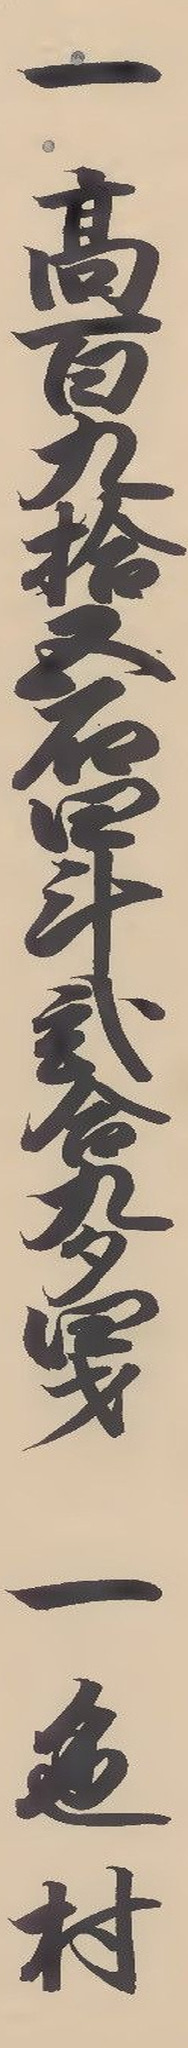一高百九拾五石四斗弐合九勺四才一色村
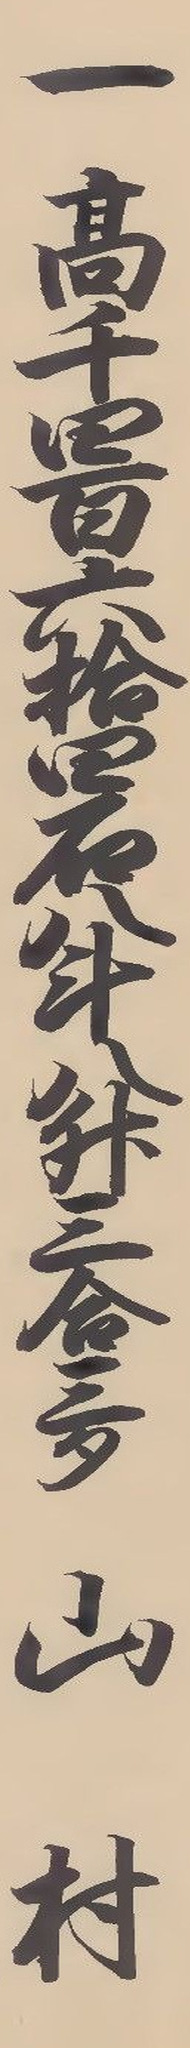一高千四百六拾四石八斗八升三合三勺山村
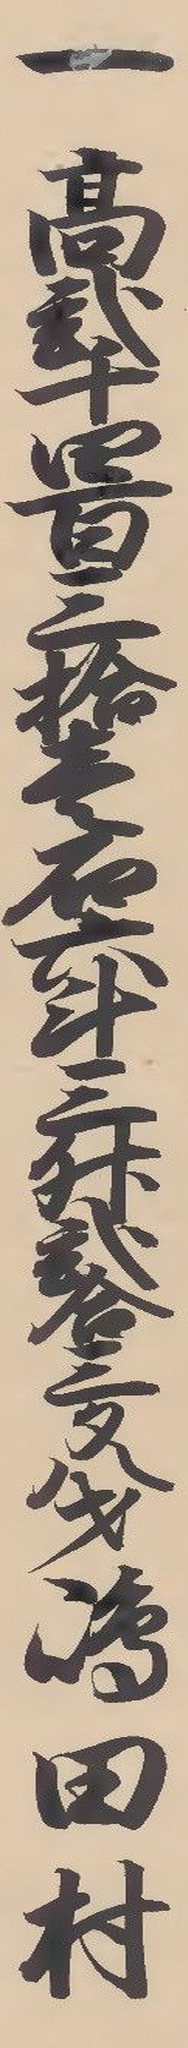一高弐千四百三拾壱石六斗三升弐合三勺八才島田村
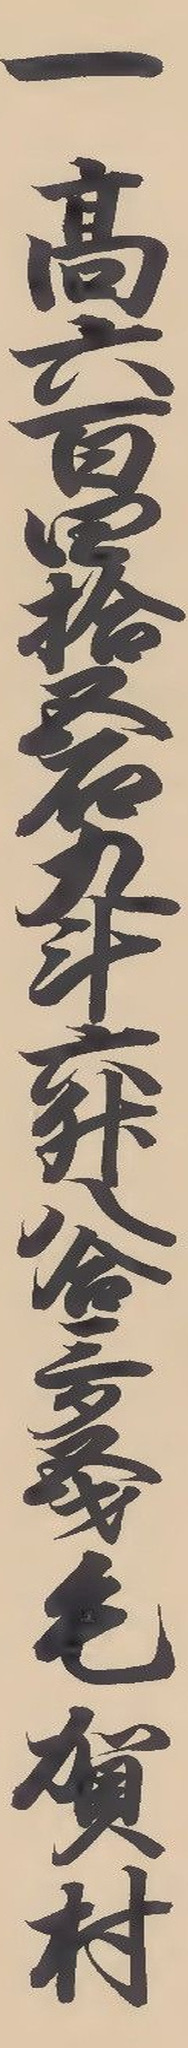一高六百四拾五石九斗六升八合三勺五才毛賀村
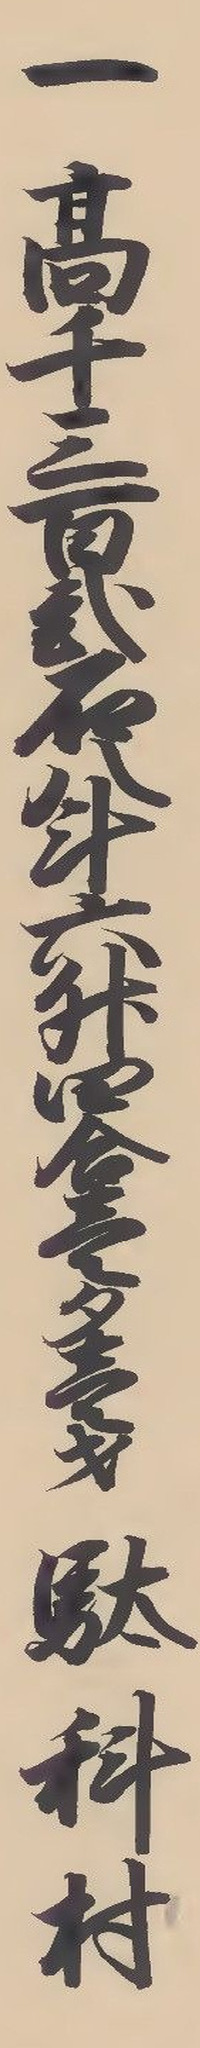一高千三百弐石八斗六升四合壱勺壱才駄科村

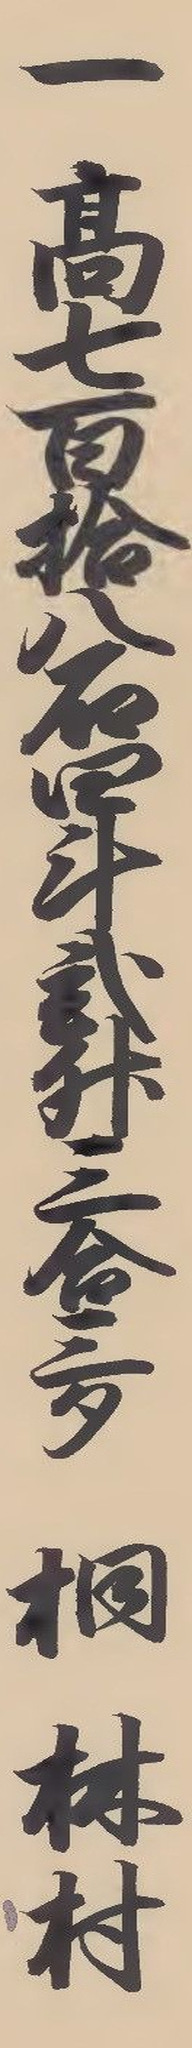一高七百拾八石四斗弐升三合三勺桐林村
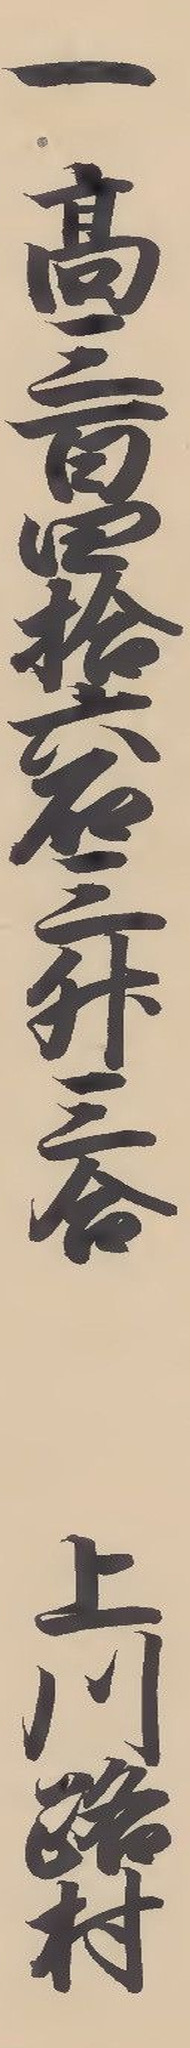一高三百四拾六石三升三合上川路村
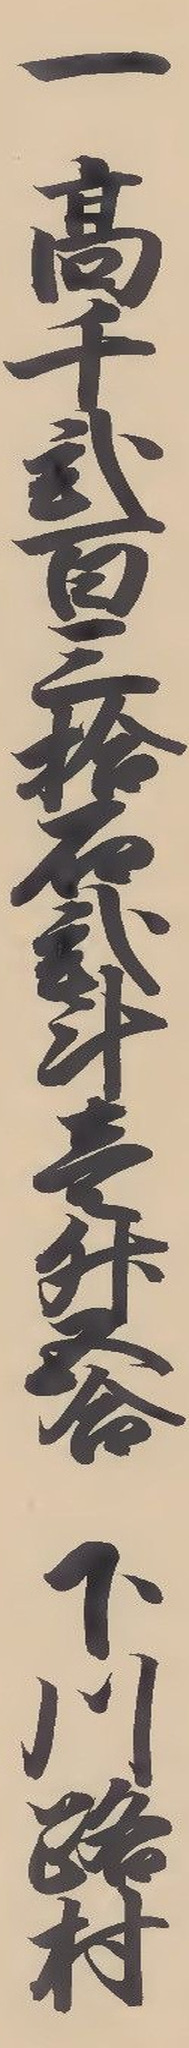一高千弐百三拾石弐斗壱升五合下川路村
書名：信濃国郷帳
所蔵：国立公文書館 National Archives of Japan
